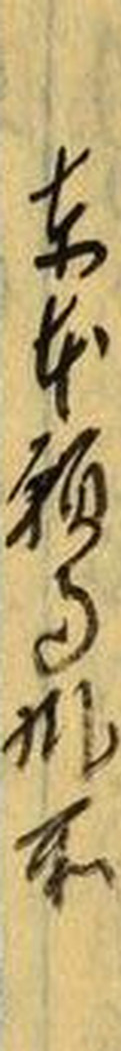東本願寺掛所
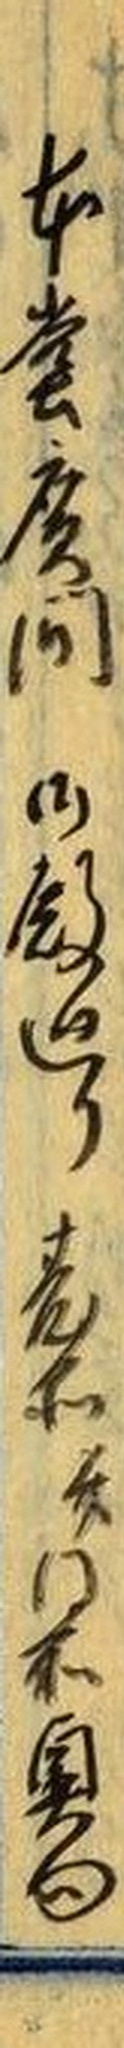本堂広間御殿廻り台所并同所奥向
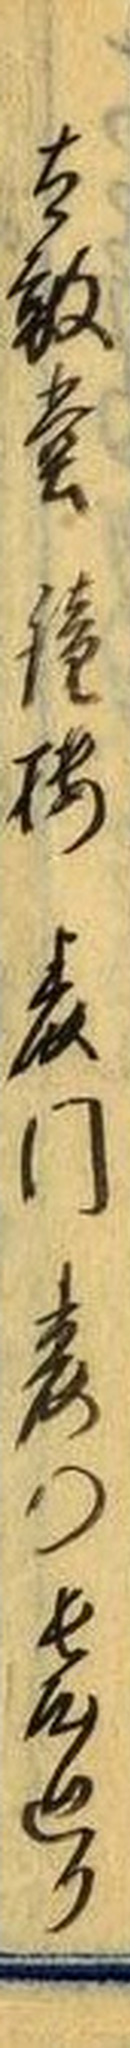太鼓堂鐘楼表門裏門長屋廻り
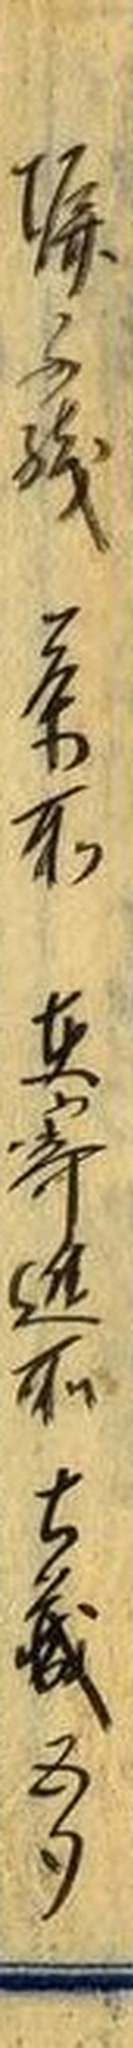塀不残茶所在寄進所土蔵五ッ
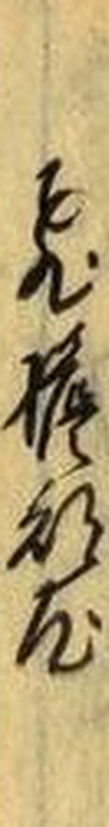飛担部屋
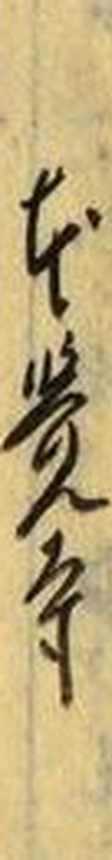本覚寺
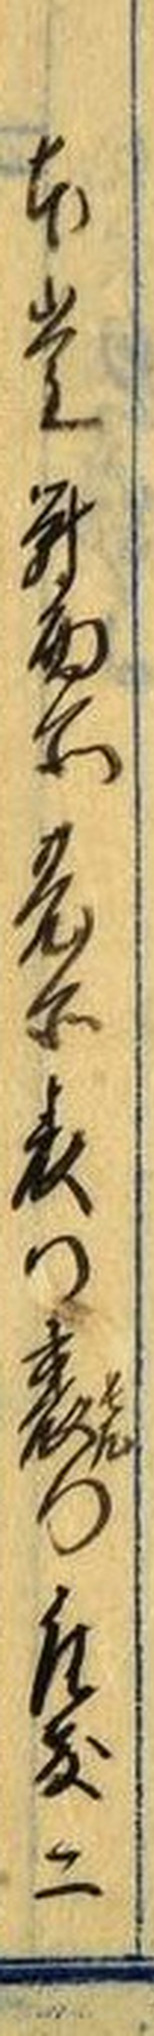本堂対面所台所表門裏長屋門屋敷二

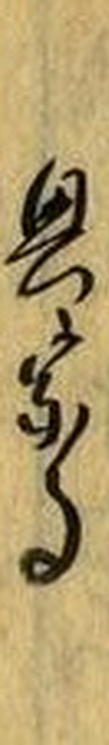興宗寺
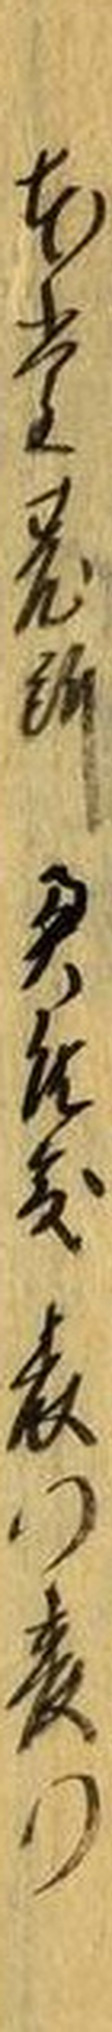本堂台所奥屋敷表門裏門
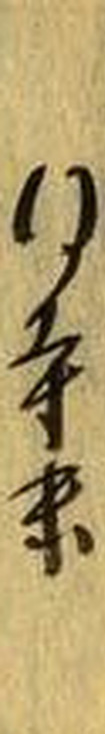同寺末
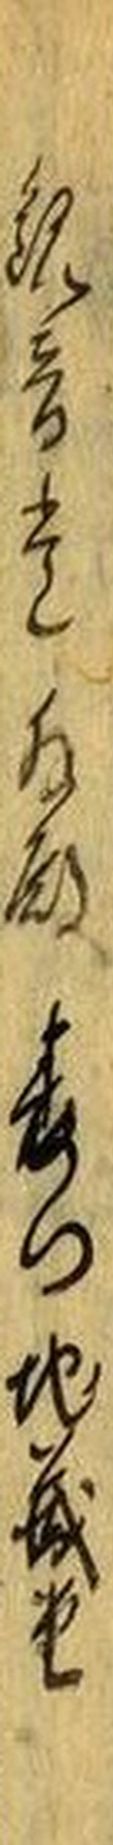観音堂拝殿表門地蔵堂
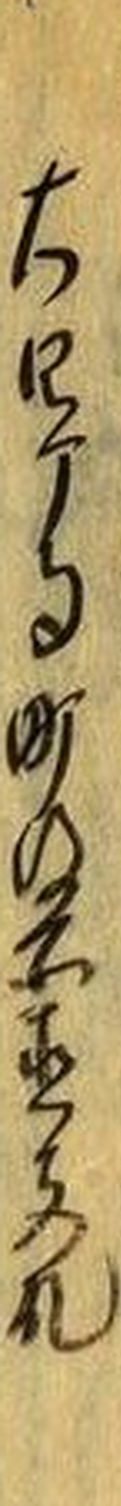右四ヶ寺町役所直支配
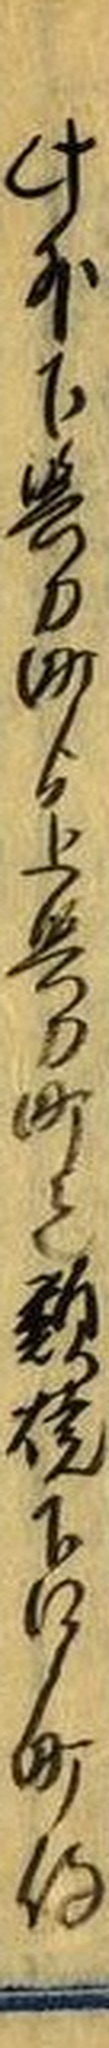此外下与力町ゟ上与力町迄類焼下江戸町侍
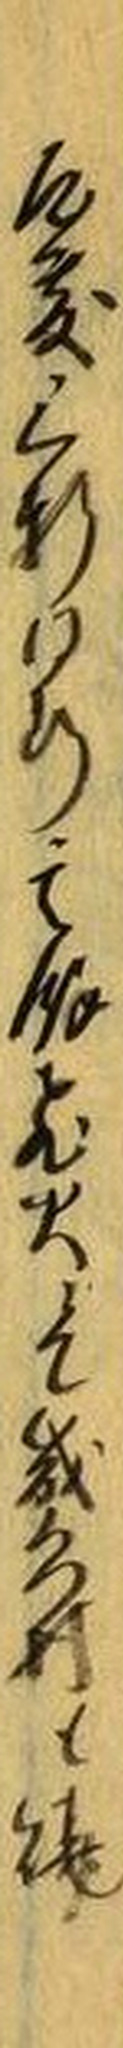屋敷三軒同断其余飛火にて幾久村も焼
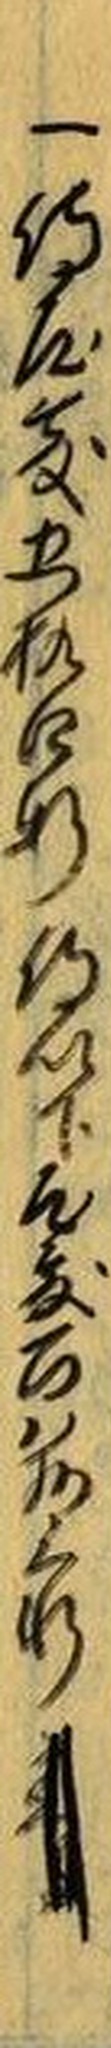一侍屋敷五拾四軒侍以下屋敷百八拾三軒
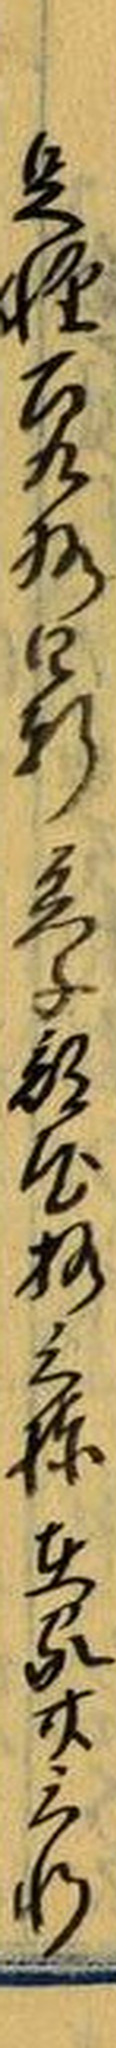足軽百九拾四軒荒子部屋拾三棟在家廿三軒
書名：温古集 五巻
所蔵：福井県文書館 Fukui Prefectural Archives
